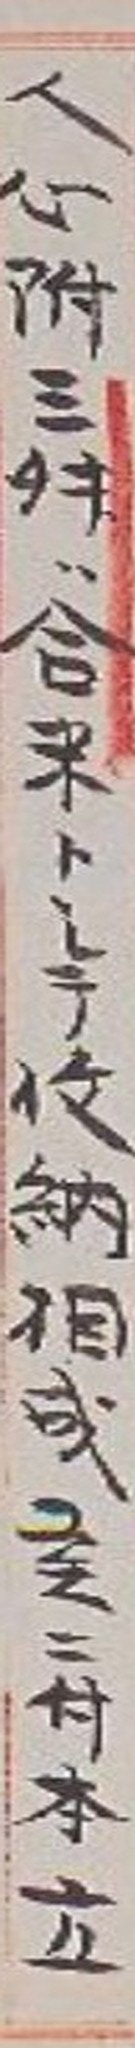人心附三升ハ合米トシテ収納相成候ニ付本立
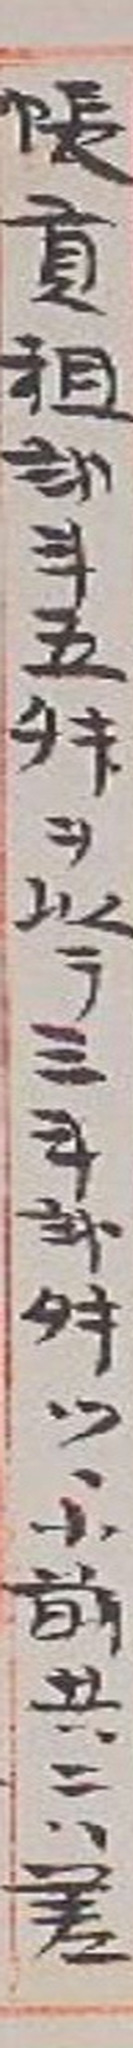帳貢租弐斗五升ヲ以テ三斗弐升ツヽ小前共ニハ差
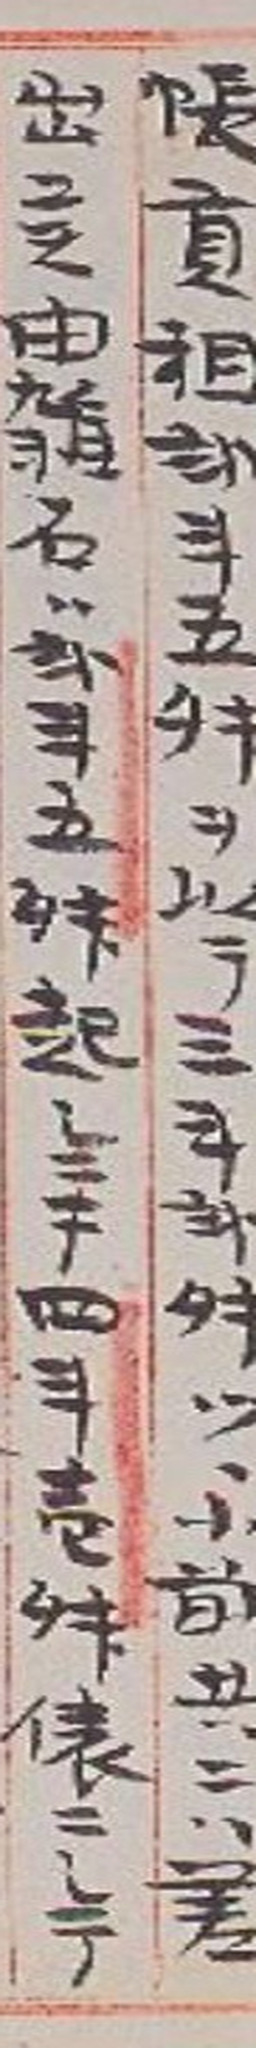出候由雑石ハ弐斗五升起シニテ四斗壱升俵ニシテ
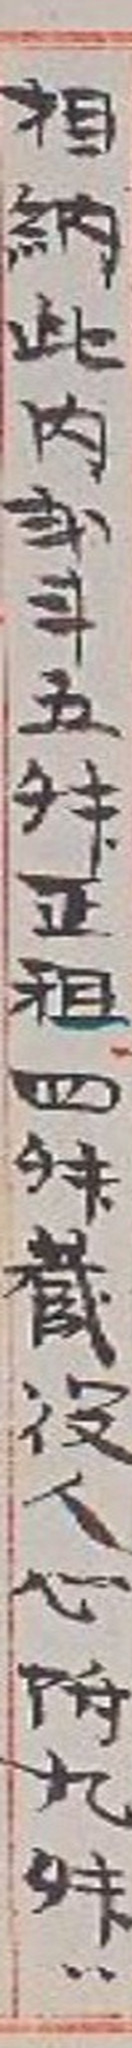相納此内弐斗五升正租四升蔵役人心附九升ハ
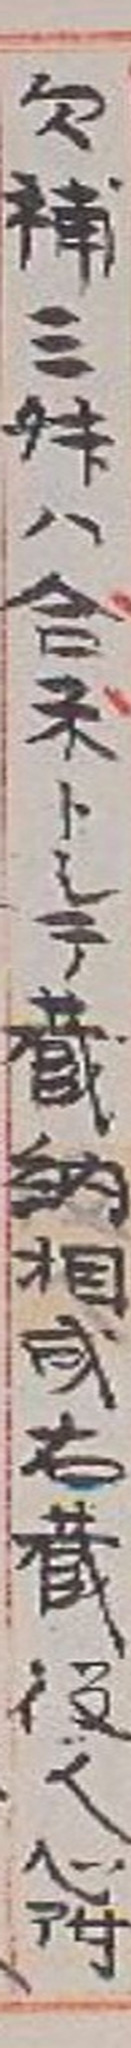欠補三升ハ合米トシテ蔵納相成右蔵役人心附
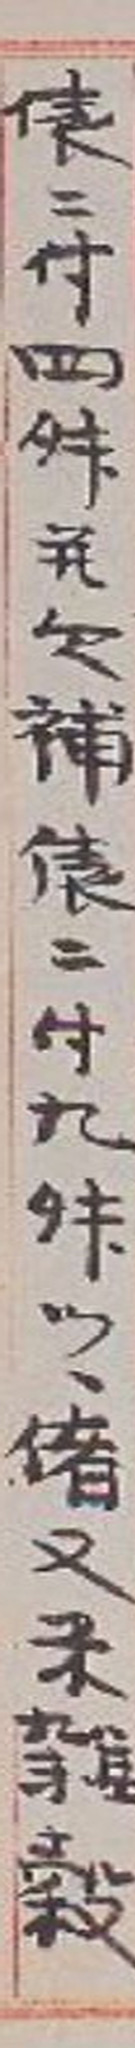俵ニ付四升并欠補俵ニ付九升ツヽ偖又米雑穀

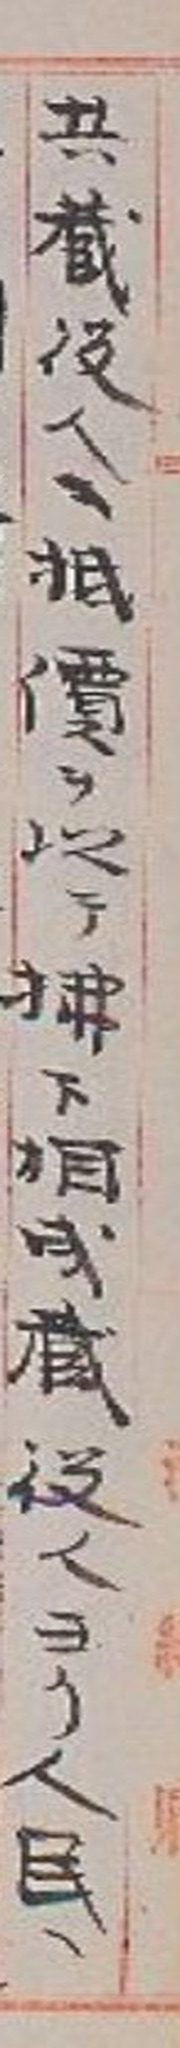共蔵役人ヘ抵価ヲ以テ払下相成蔵役人ヨリ人民へ
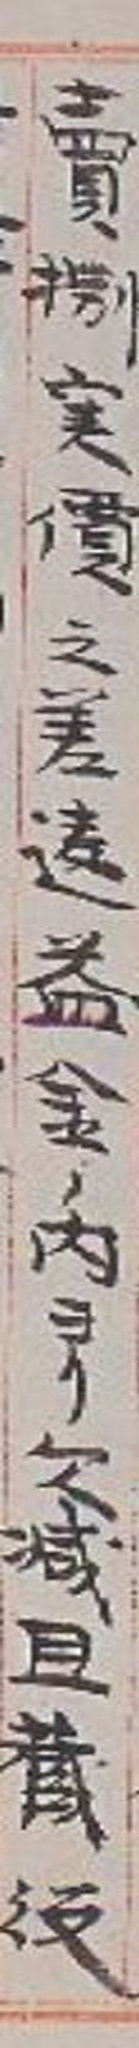売捌実価之差違益金ノ内ヨリ欠減且蔵役
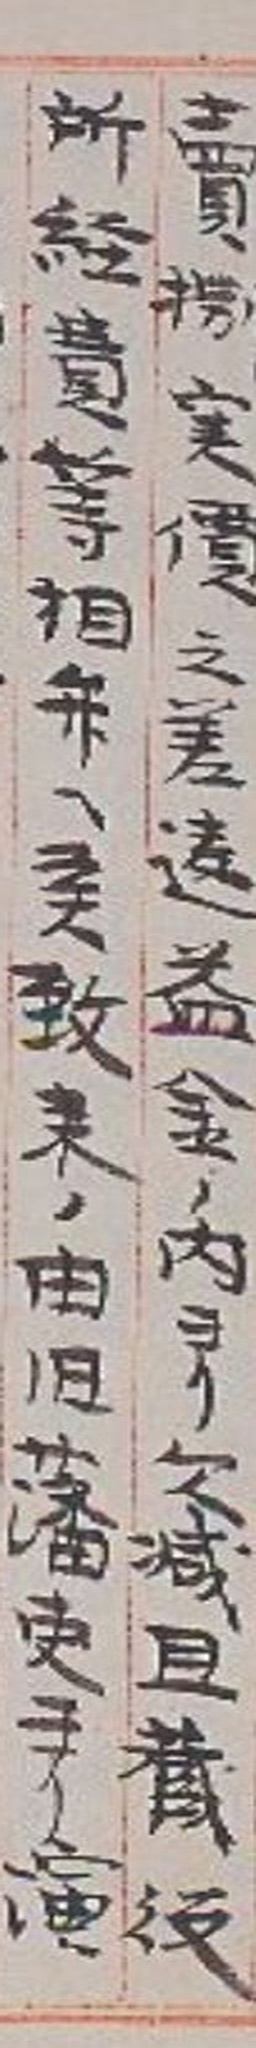所経費等相弁ヘ候致来ノ由旧藩吏ヨリ演
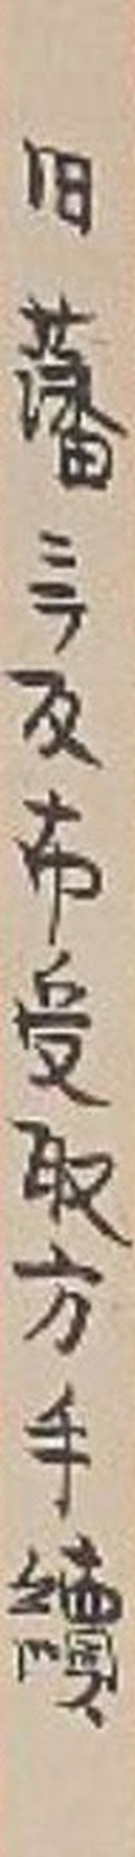旧藩ニテ反布受取方手続
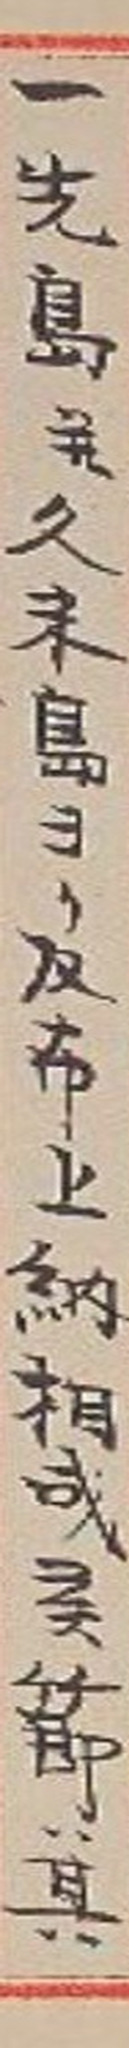一先島并久米島ヨリ反布上納相成候節ハ其
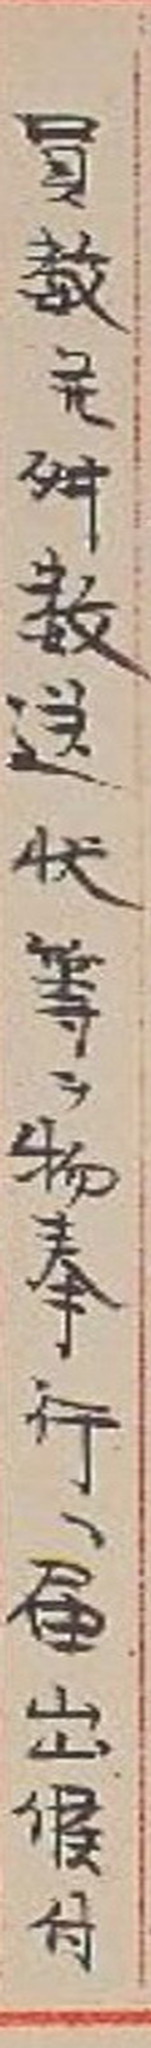員数并升数送状等ヲ物奉行ヘ届出候付
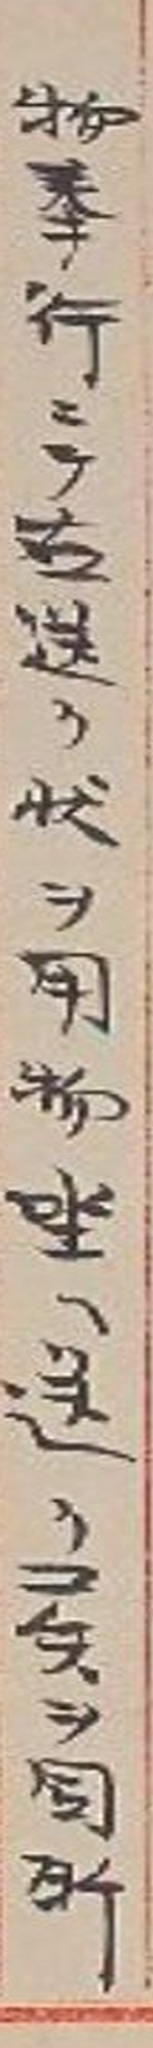物奉行ニテ右送リ状ヲ用物坐へ送リ候ヲ同所
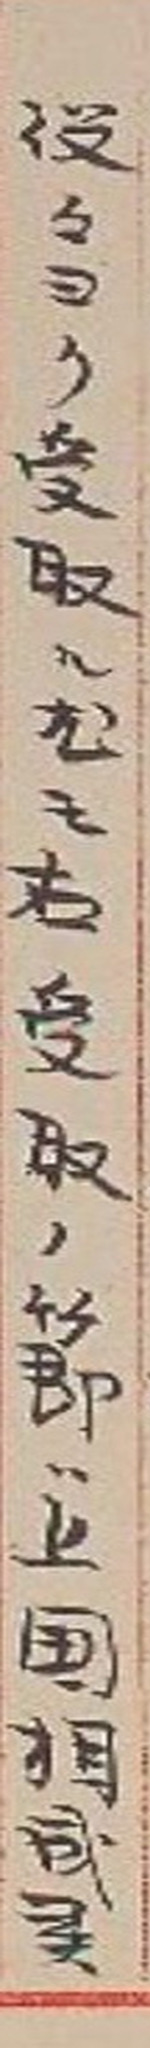役々ヨリ受取ル尤モ右受取ノ節ハ上国相成候
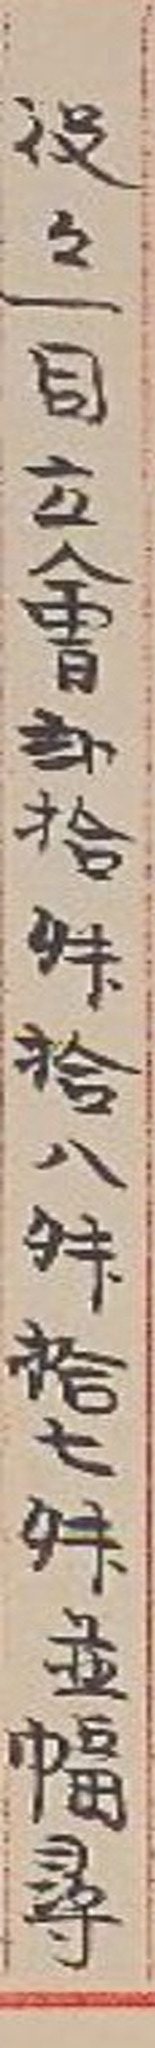役々一同立会弐拾升拾八升拾七升並幅尋
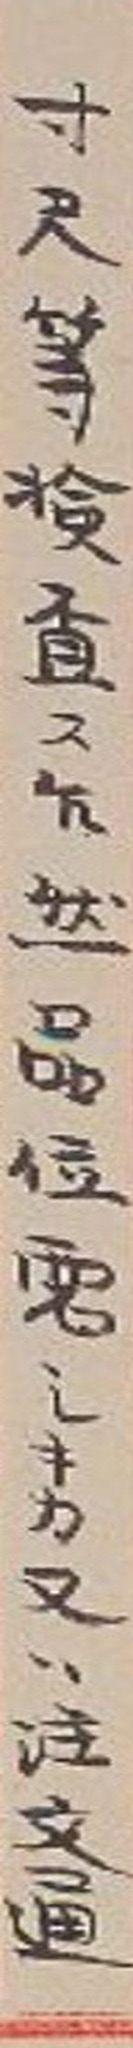寸尺等検査スレハ然品位悪シキカ又ハ注文通
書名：貢納物品領収旧藩慣例並ニ置県後取扱順序
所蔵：University of the Ryukyus Library
